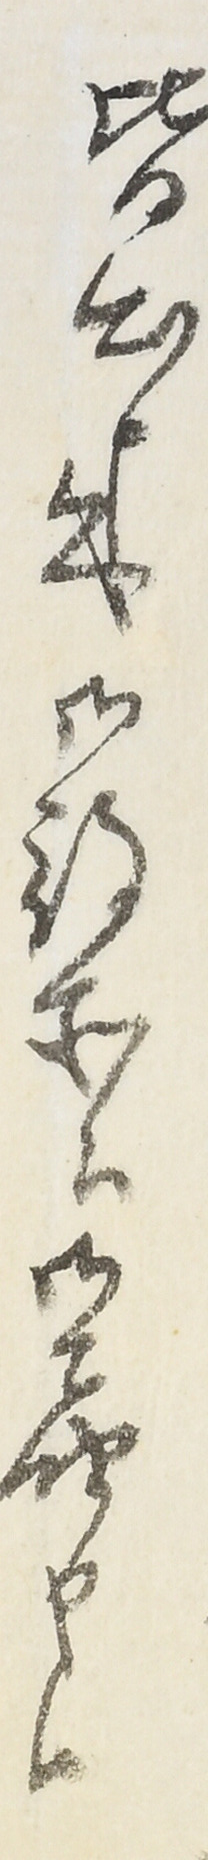皆出来御役所江御届申候
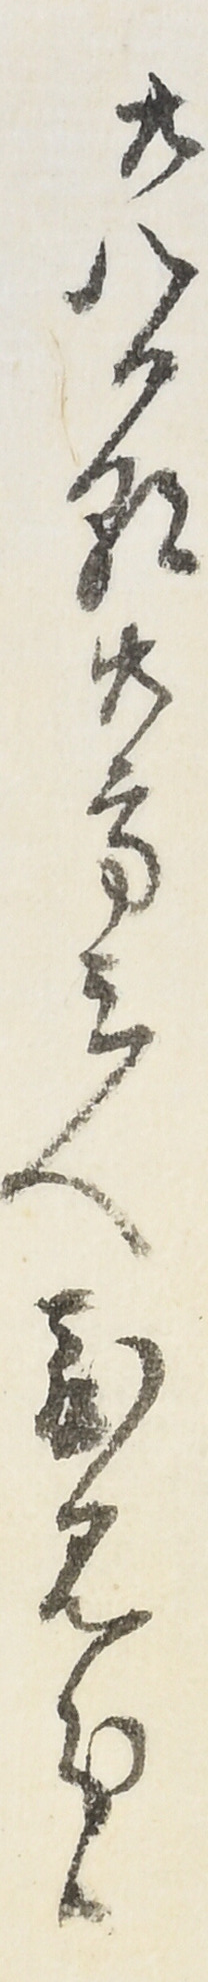廿八日朝廿方三人致見分候

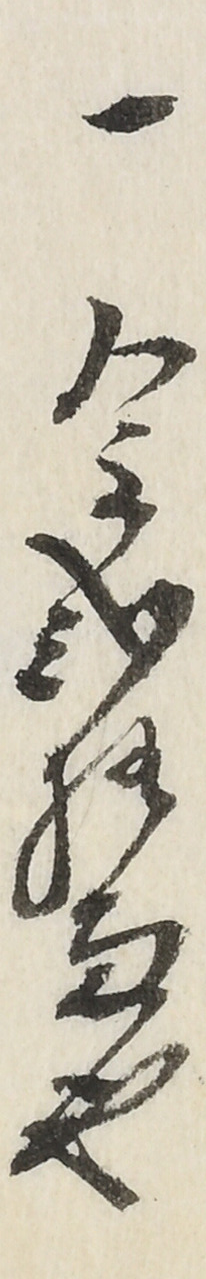一金弐拾両也
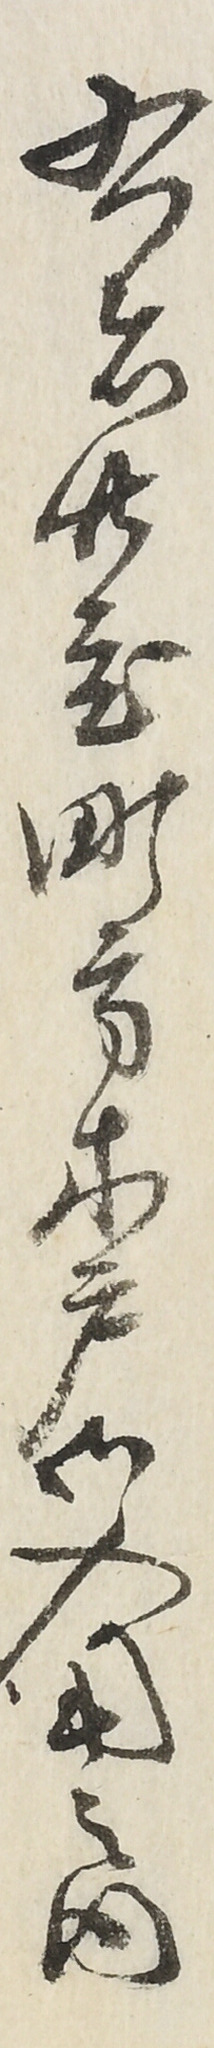右者竹屋町方木戸御入用之内
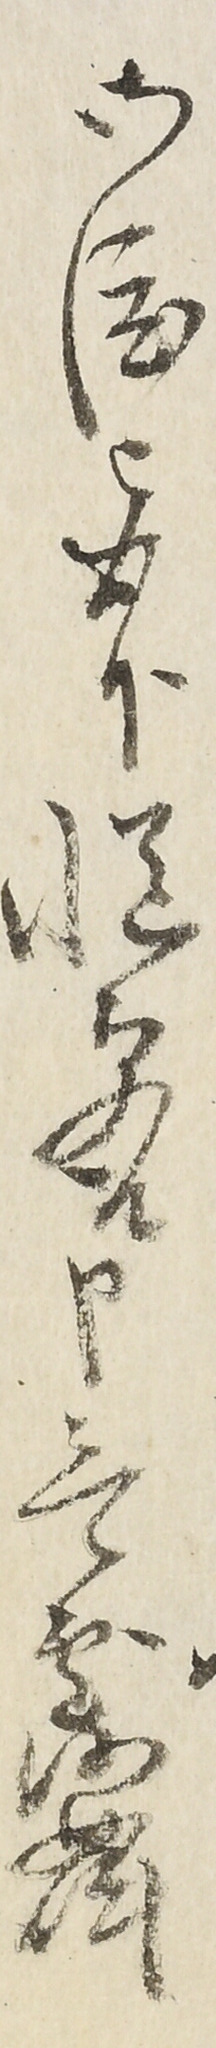御渡被成下慥受取申上候処仍如件
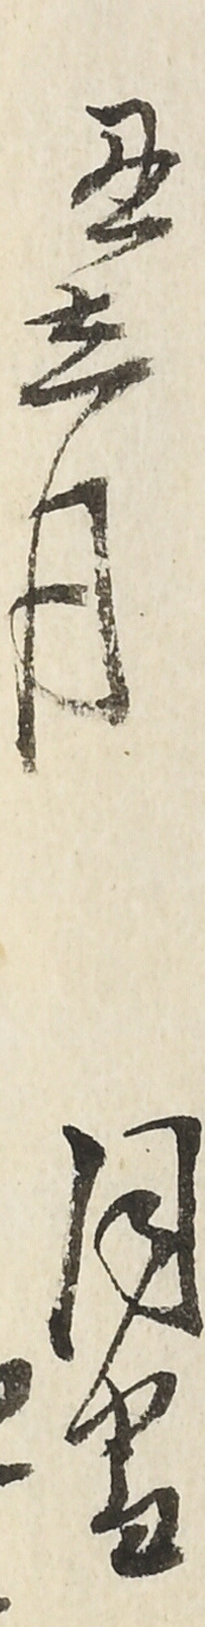丑去月月番
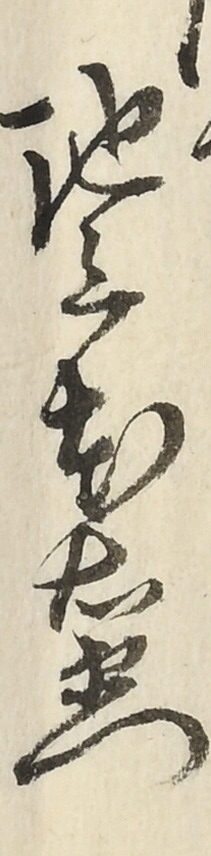池上本右衛門
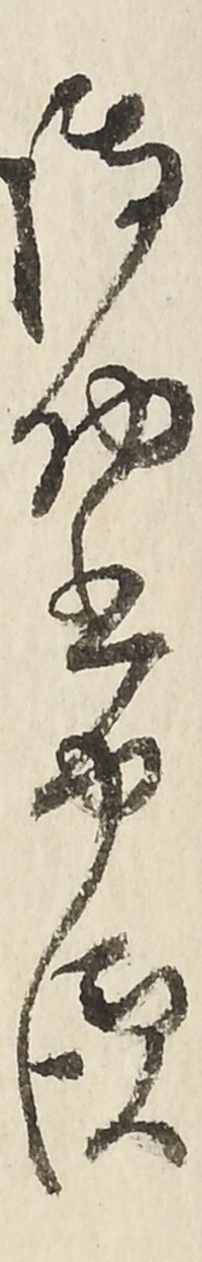御物書中様
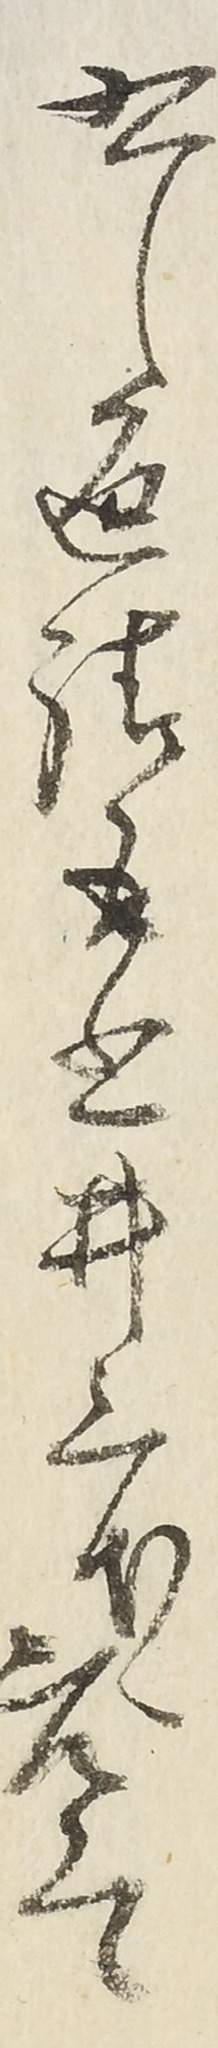右之通請取書井上屋へ差上候
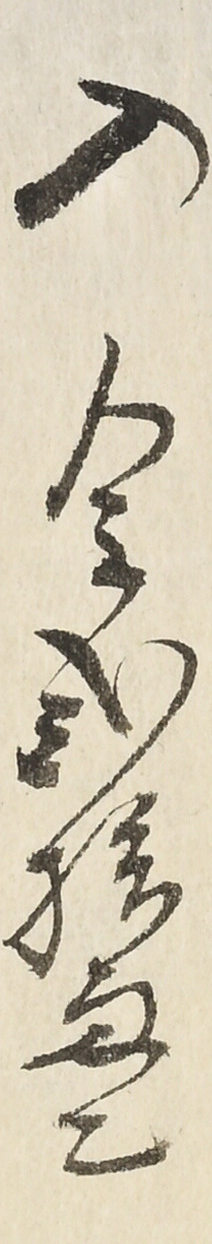一金弐拾両也
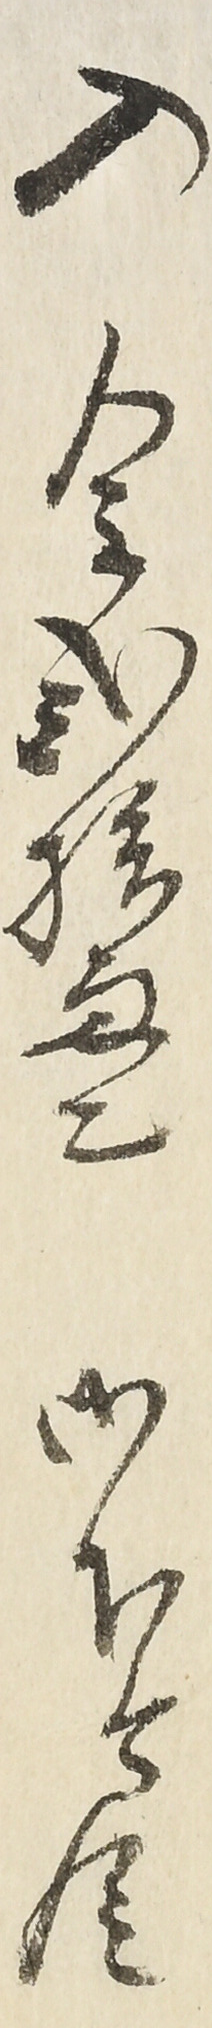入金弐拾両也御下ヶ候
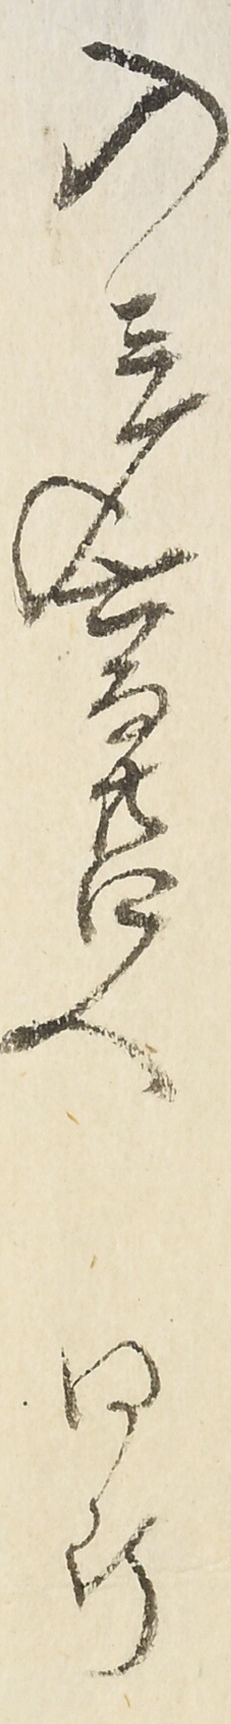入壱貫六百廿四文同断
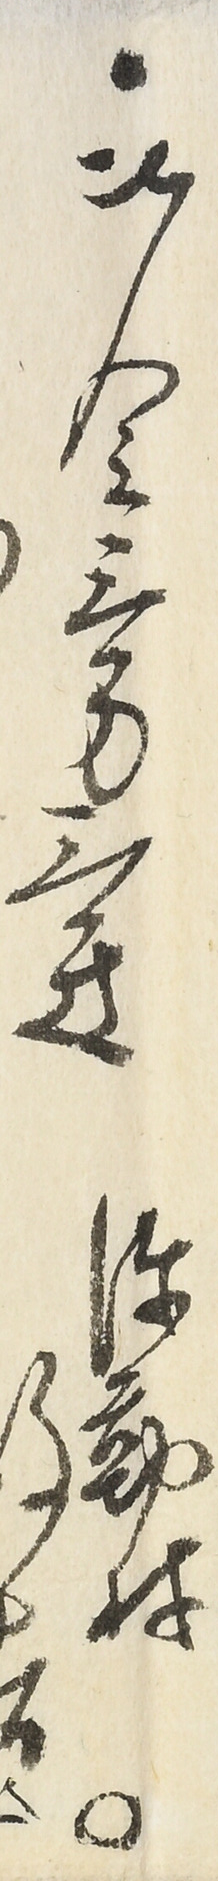●出金三分三朱弥勒村
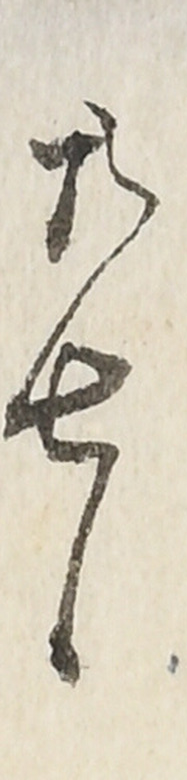廿八日
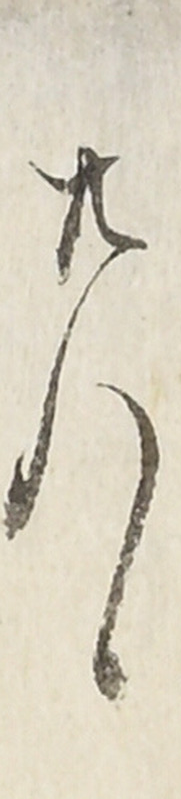廿八日
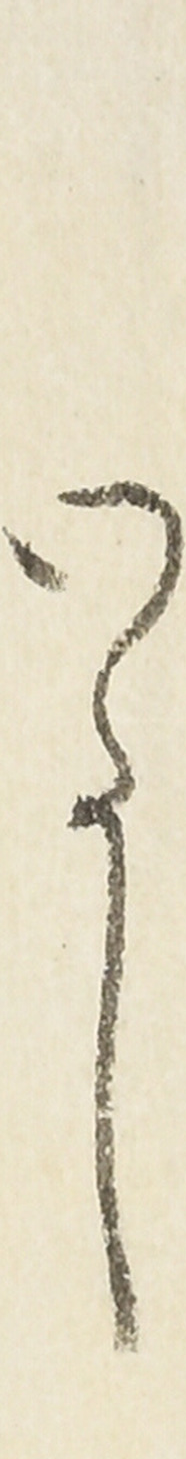わたし
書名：町方木戸御普請諸事附（一括）
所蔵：伊那市立高遠町図書館・合同会社AMANE
